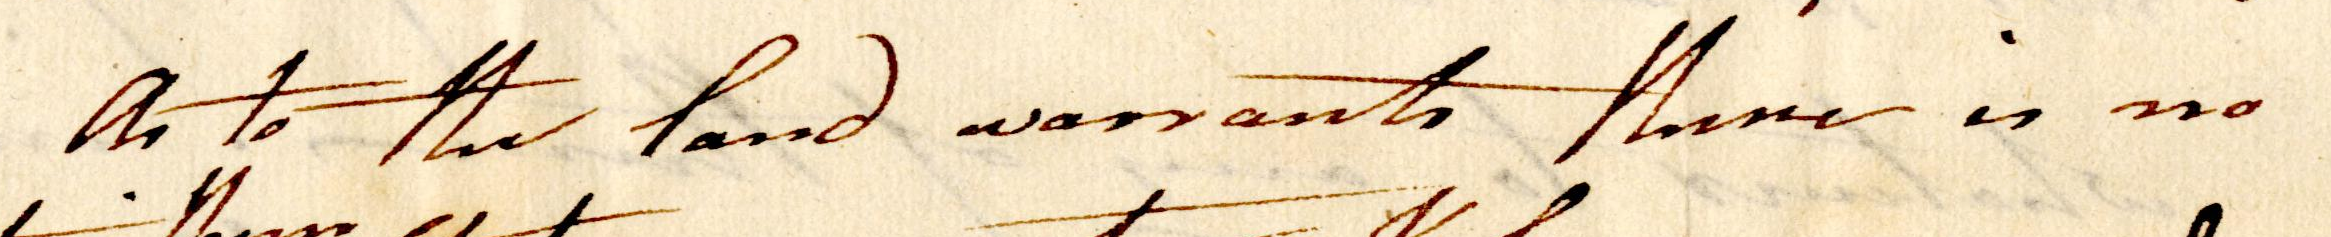as to the land warrants there is no
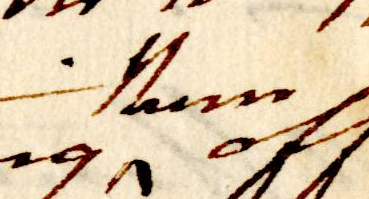them
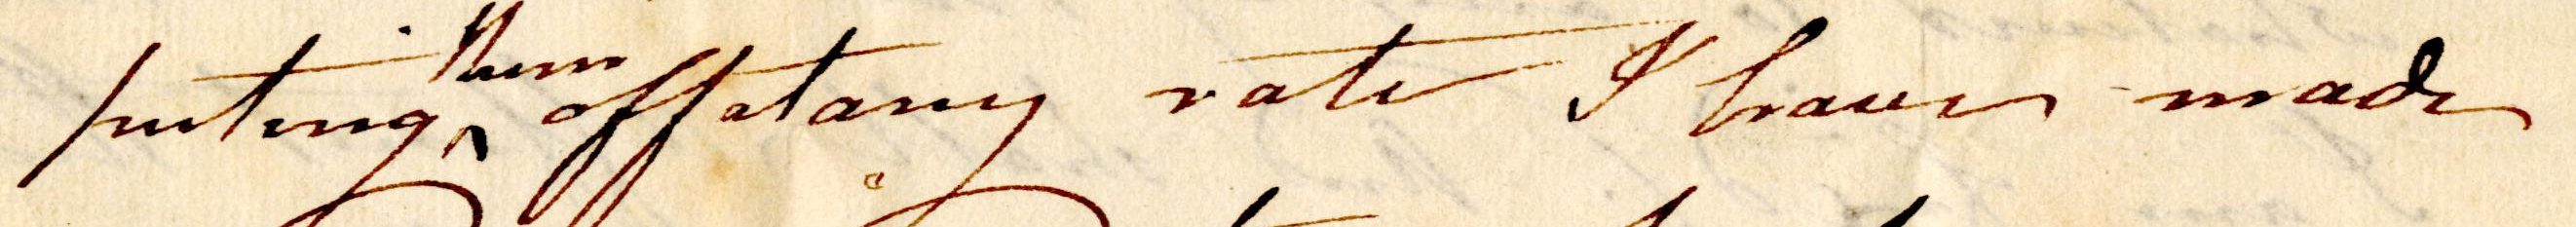puting ^ off at any rate I have made
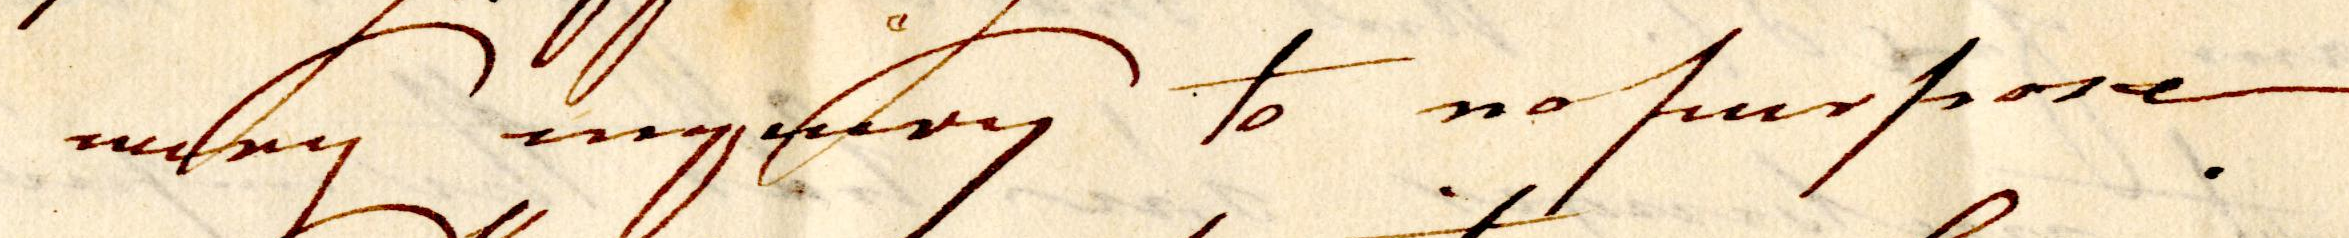many inquiry to no purpose
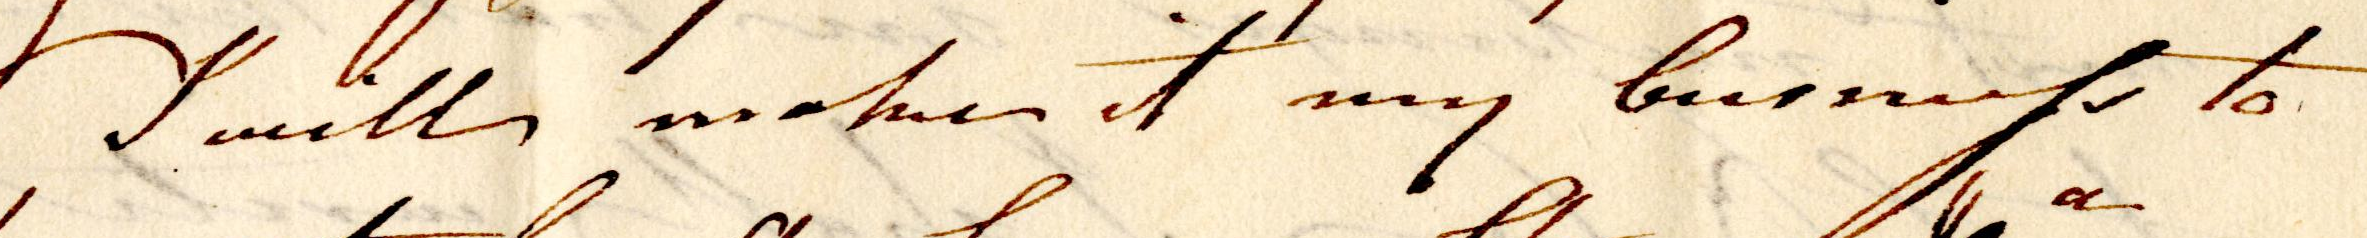I will make it my business to
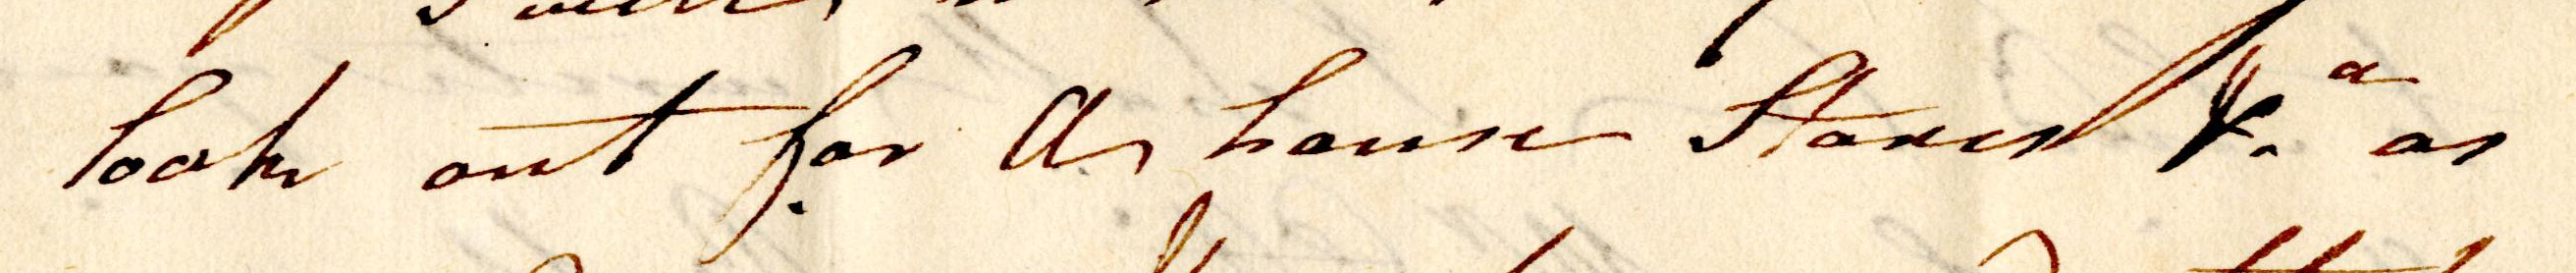look out for A house Staves &c^a as
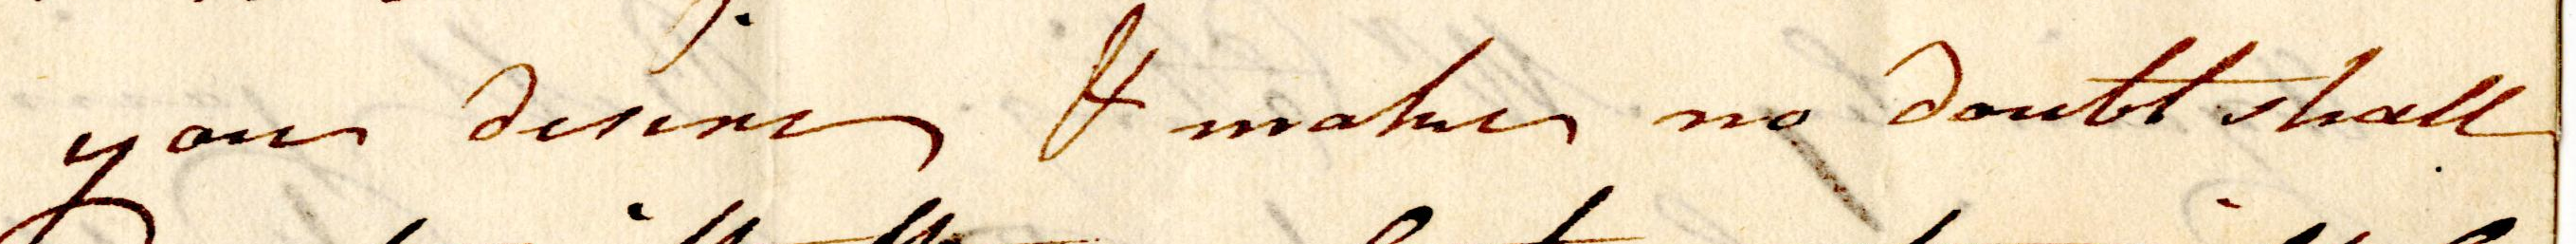your desine, & make no doubt shall
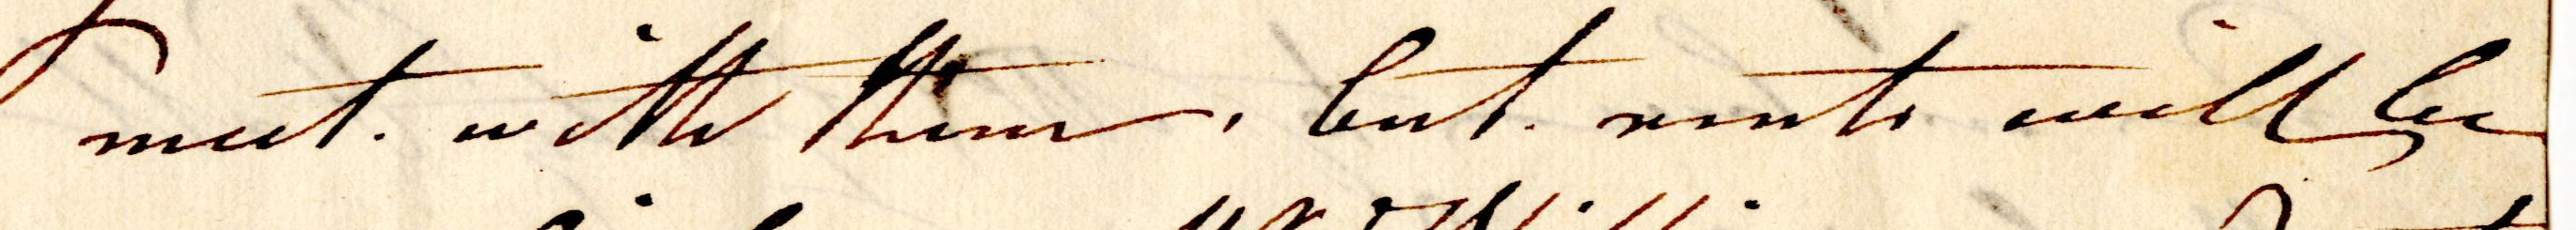meet with them, but rents will be
